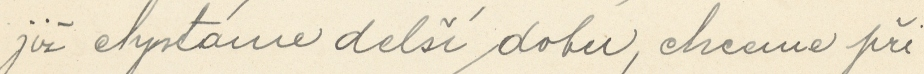již chystáme delší dobu, chceme při
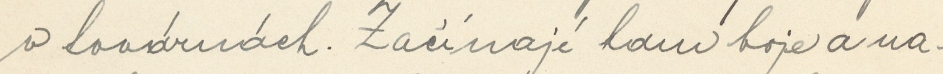v továrnách. Začínají tam boje a na-
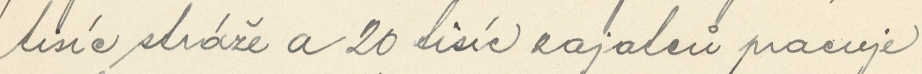tisíc stráže a 20 tisíc zajatců pracuje
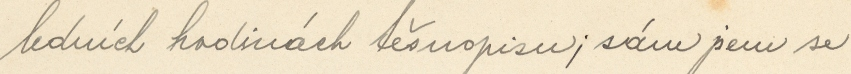ledních hodinách těsnopisu; sám jsem se
